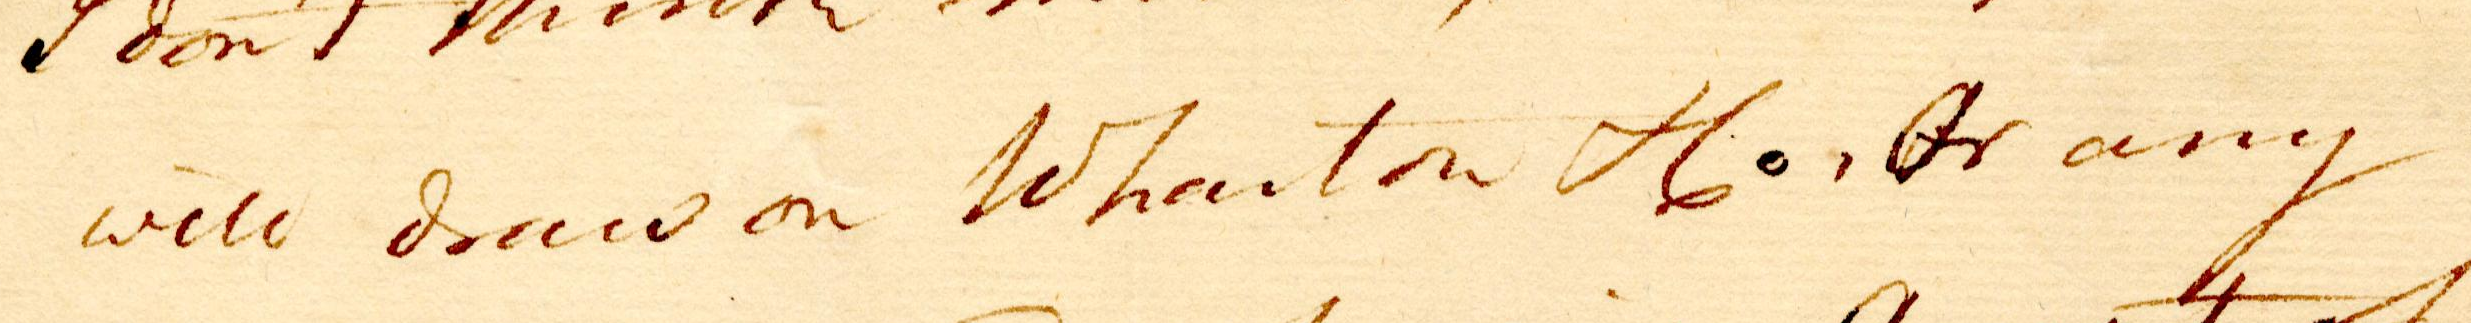will draw on Wharton &Co, Or any
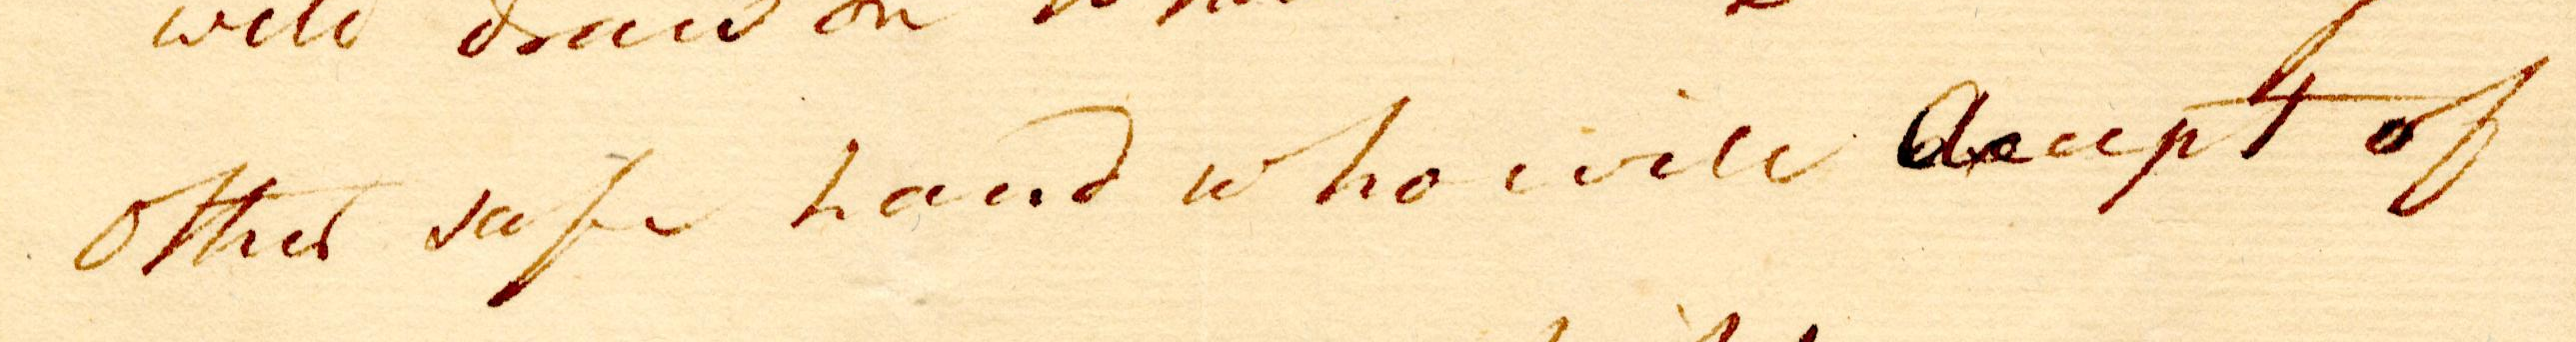other safe hand who will Accept of
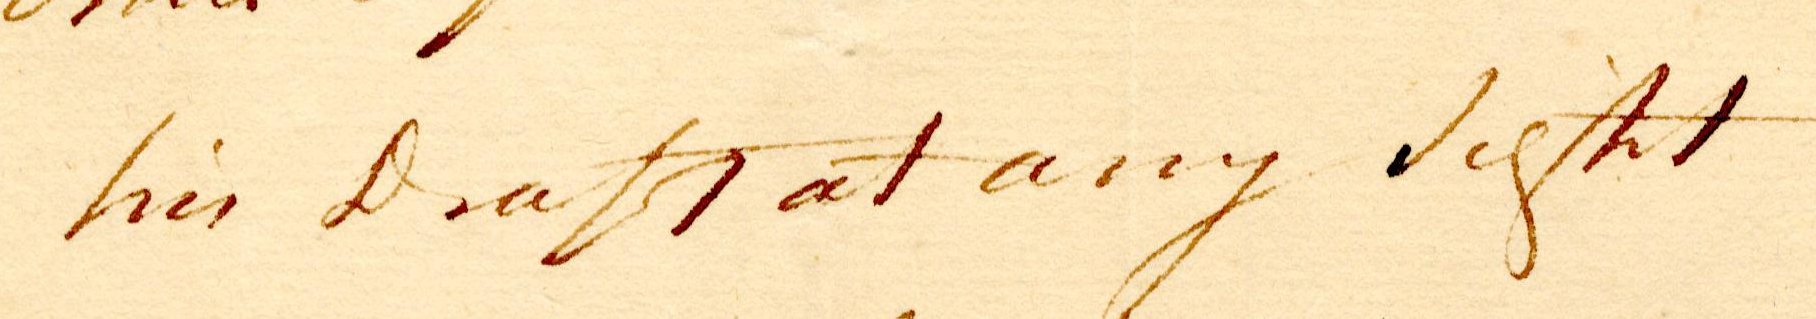his Drafts at any Sight
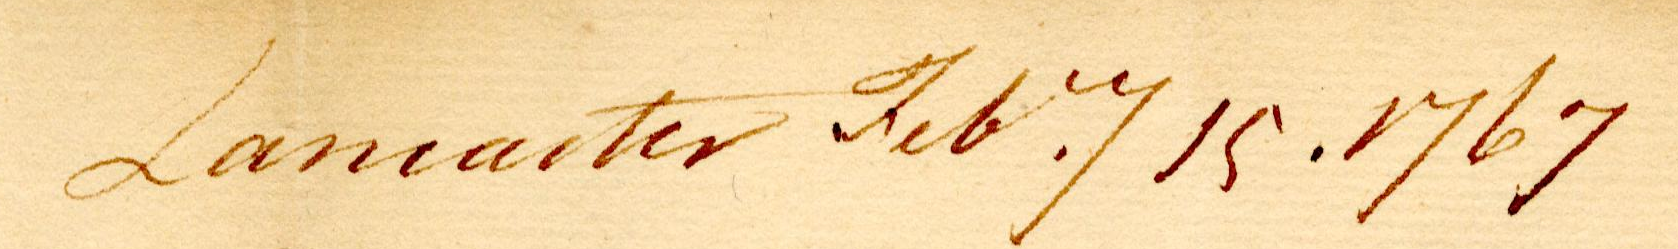Lancaster Feb^y. 15. 1767
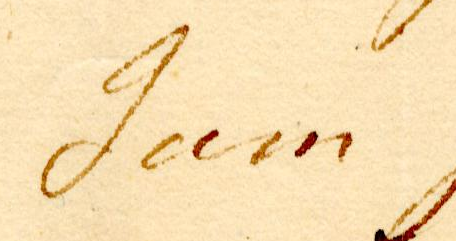I am
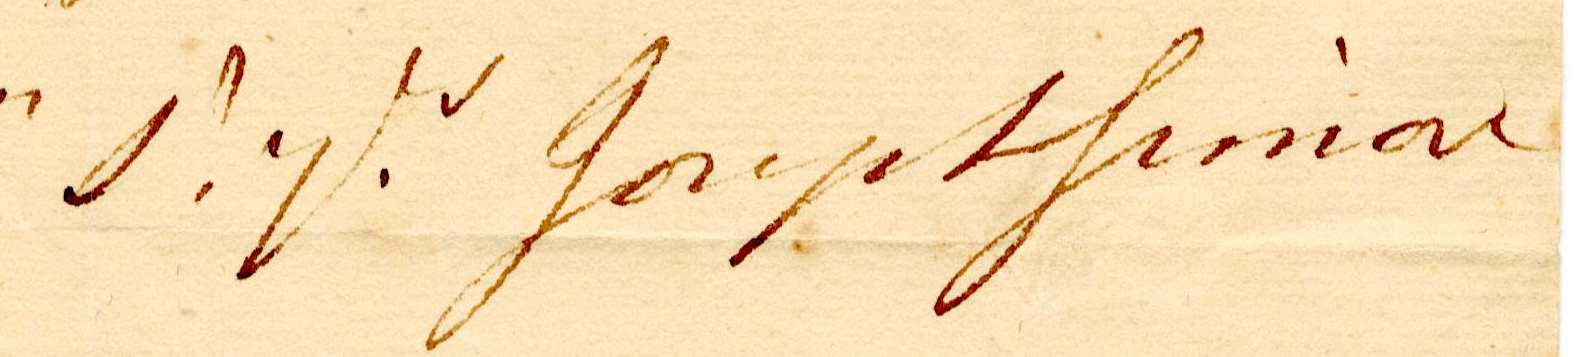S^r. y^r. Joseph Simon
